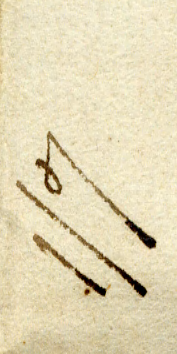1/7
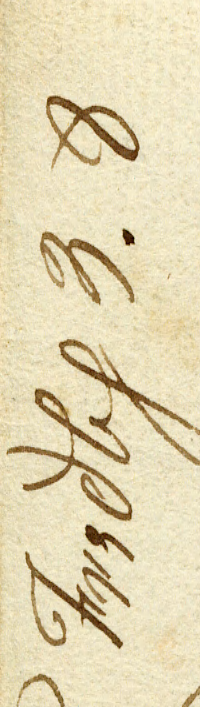Fredbg 3.8
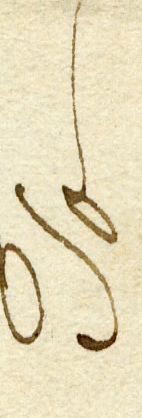To
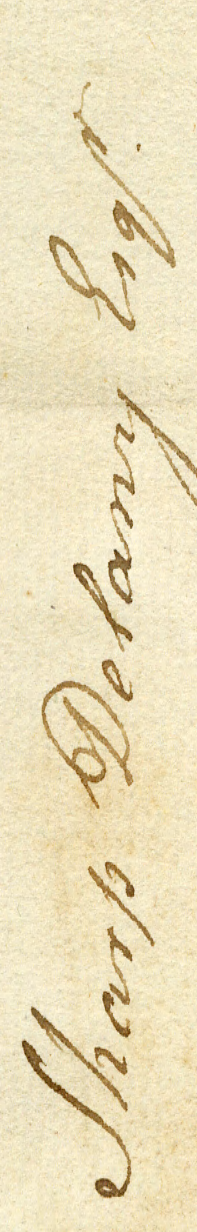Sharp Delany Esq^r.
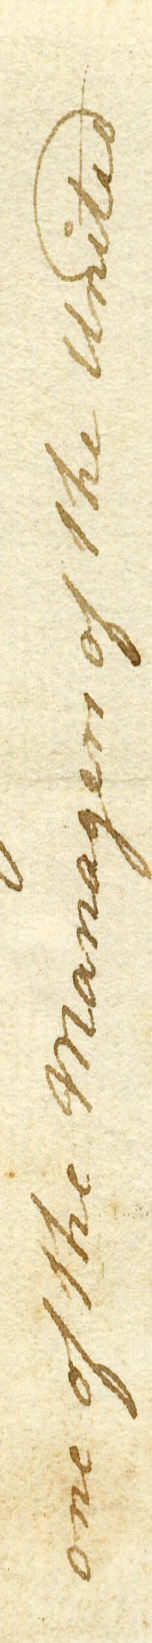one of the Managers of the United States
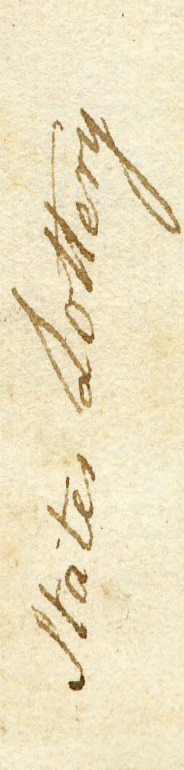States Lottery
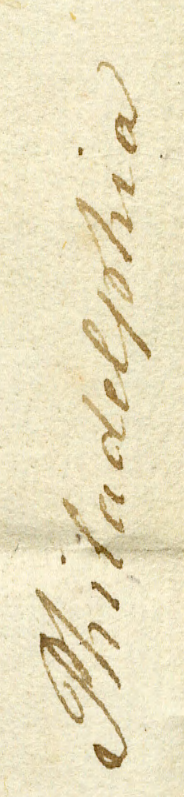Philadelphia
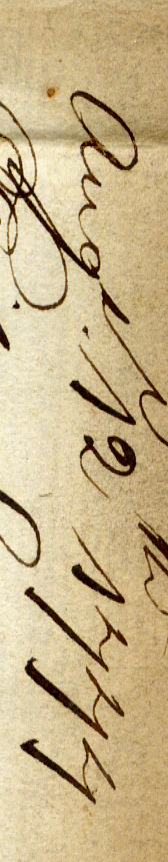Aug^t. 12^th 1777
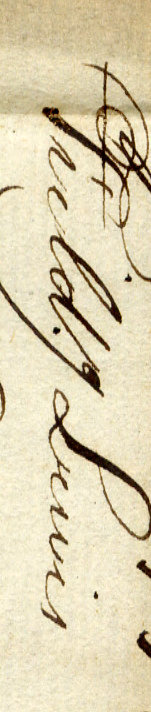Field.^g Lewis
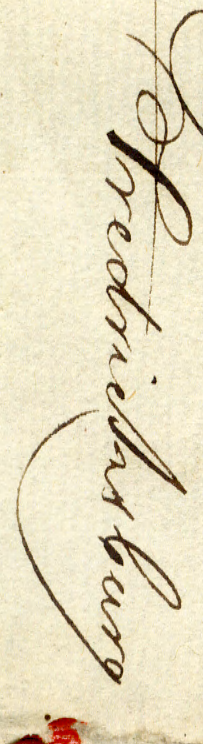Fredricksburg
